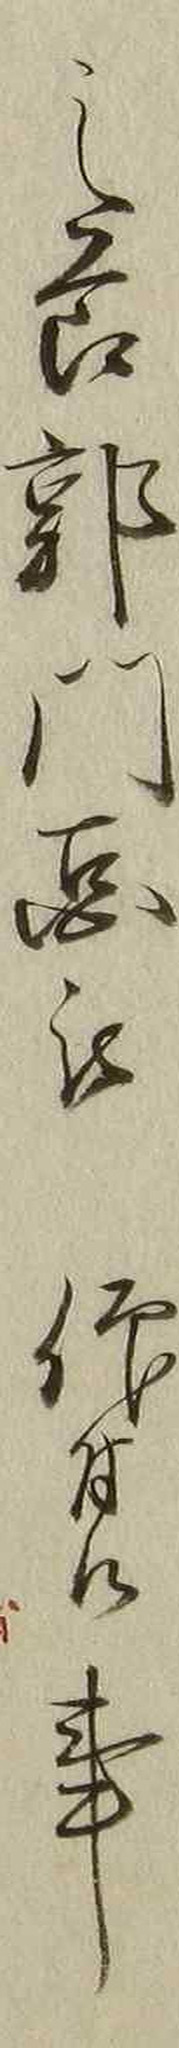之節郭門固被仰付候事
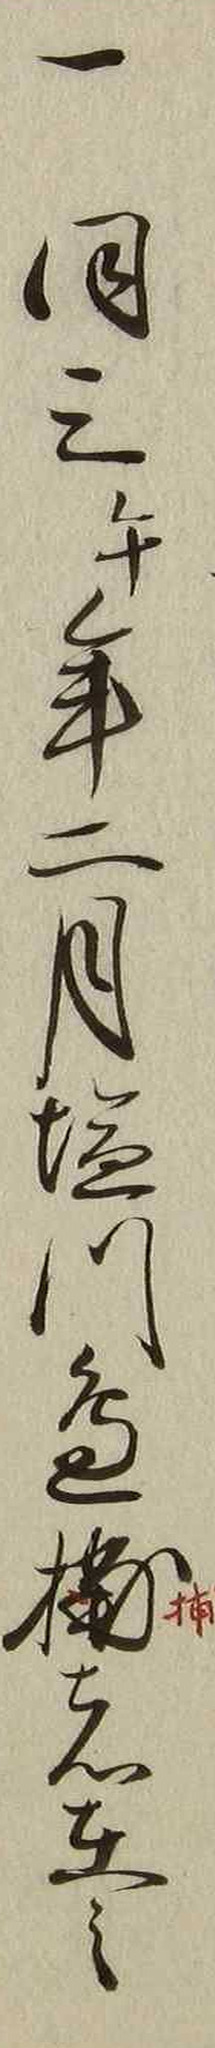一同三午年二月塩川辺捕者在之
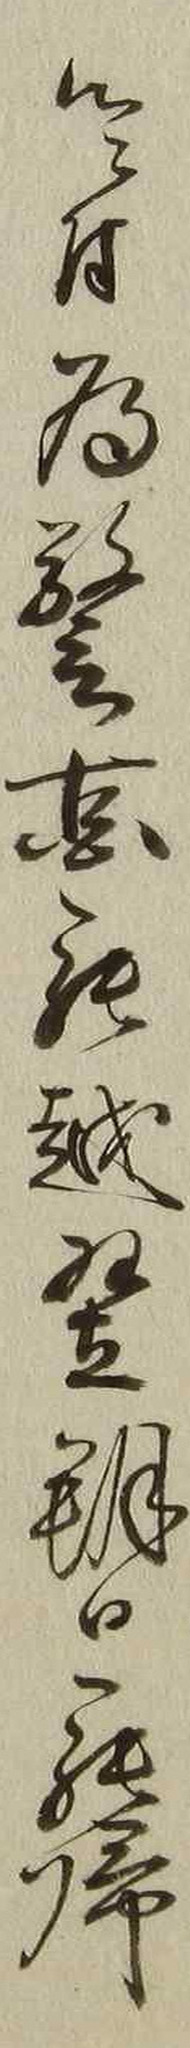候に付為警固罷越翌朔日罷帰
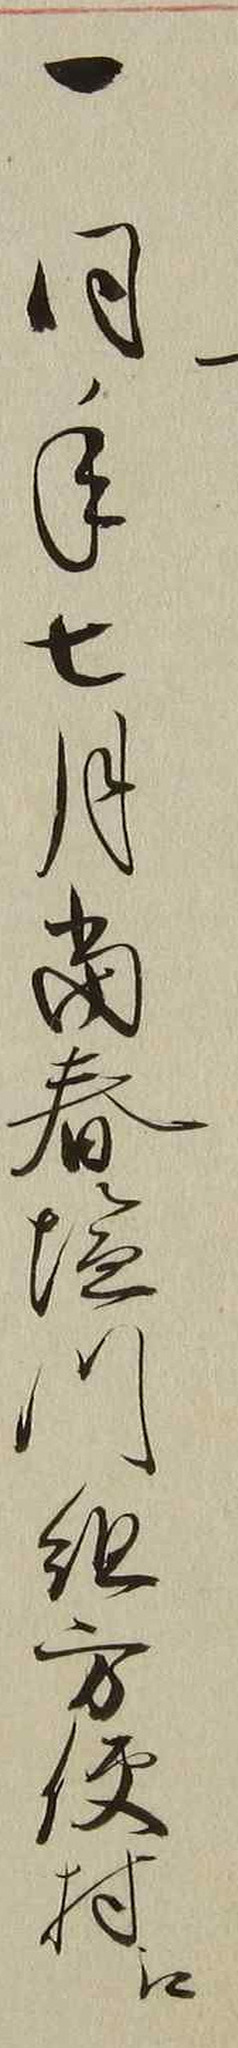一同七月当春塩川組方便村江
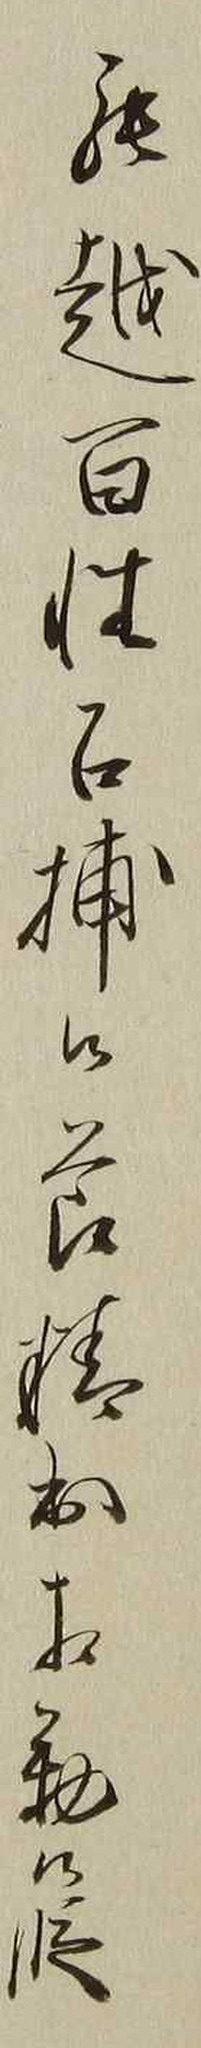罷越百性召捕候節精出相勤侯段
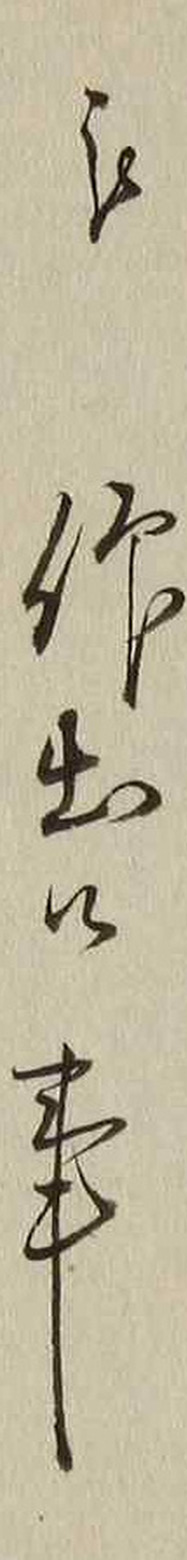被仰出候事
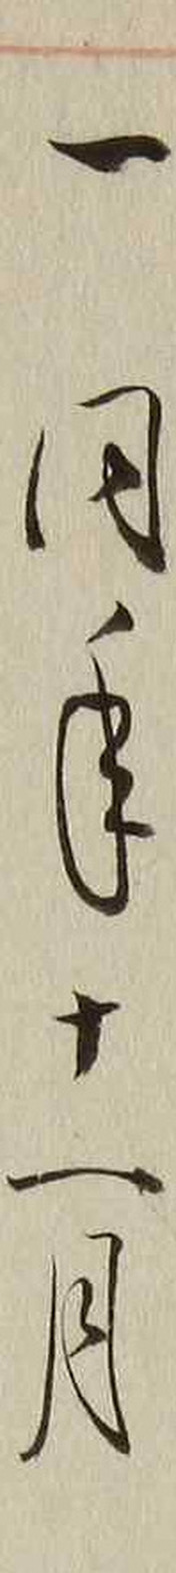一同年十一月
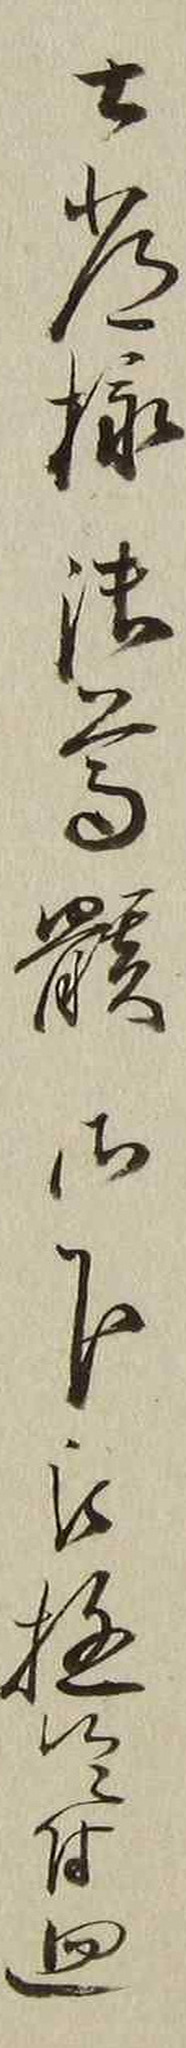土常様御尊骸御下被遊候に付廻
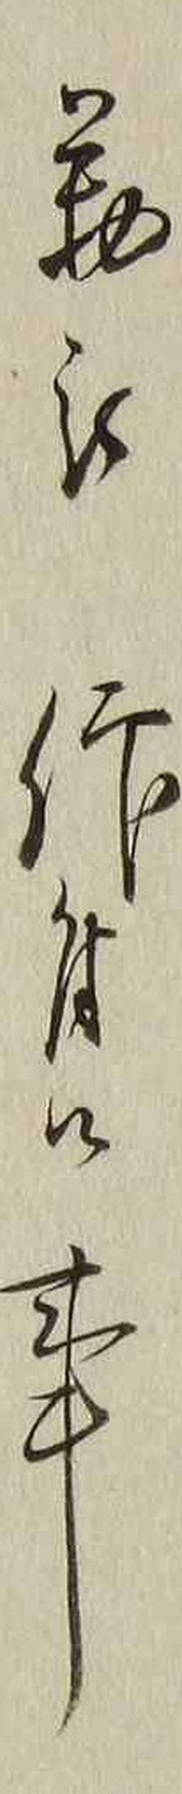勤被仰付候事
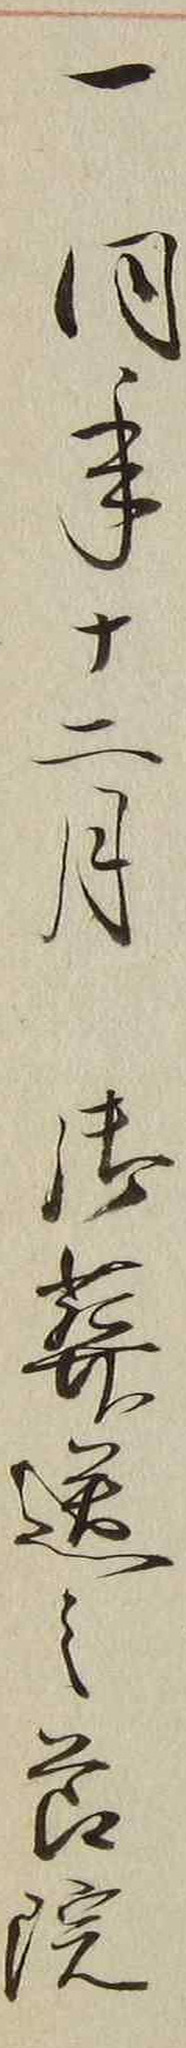一同年十二月御葬送之節院
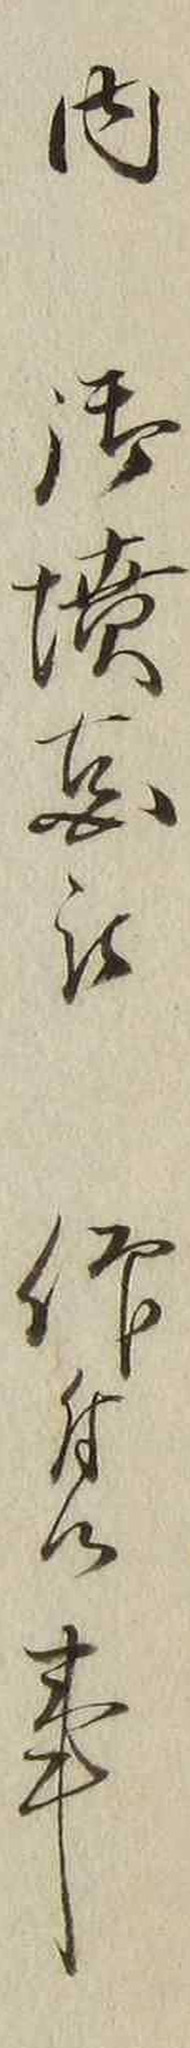内御墳固被仰付候事
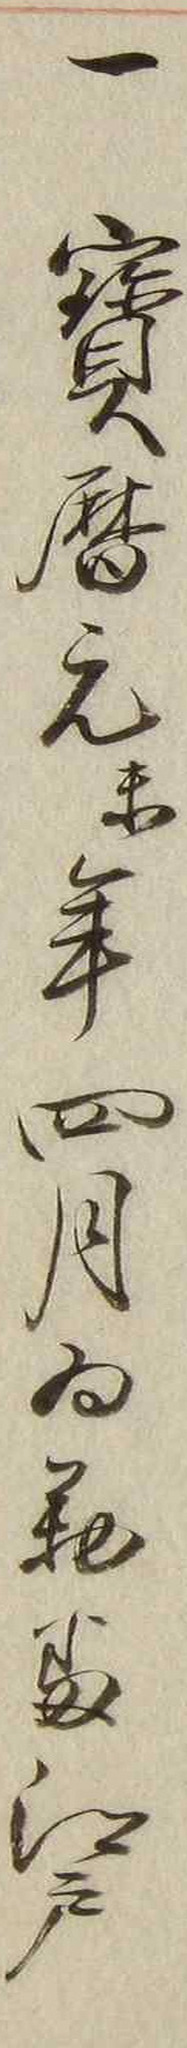一宝暦元未年四月為勤番江戸
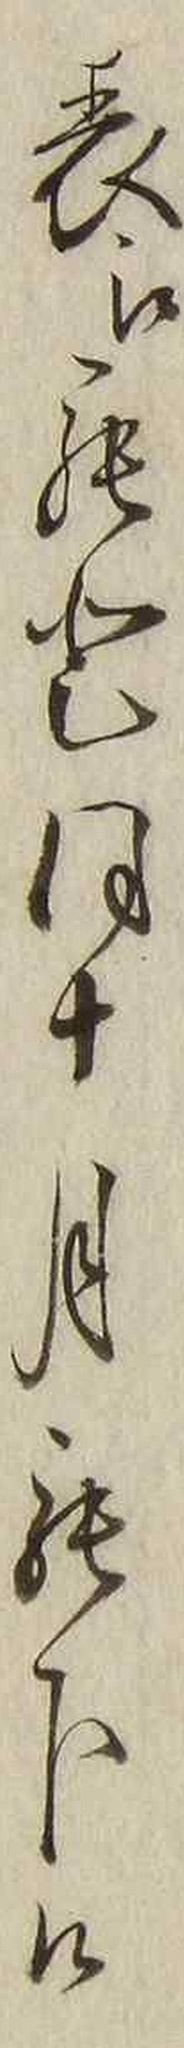表江罷登同十月罷下候
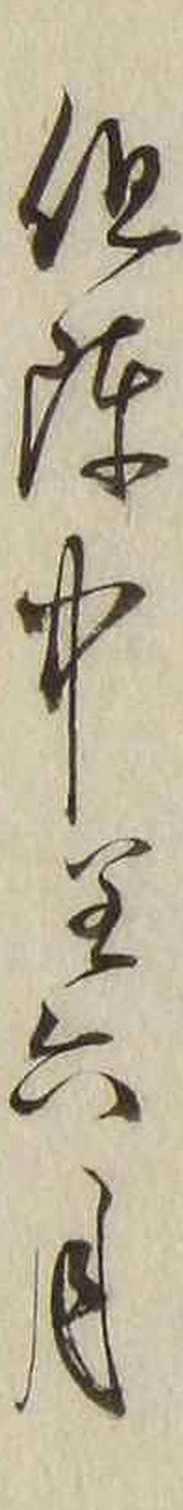但陣中閏六月

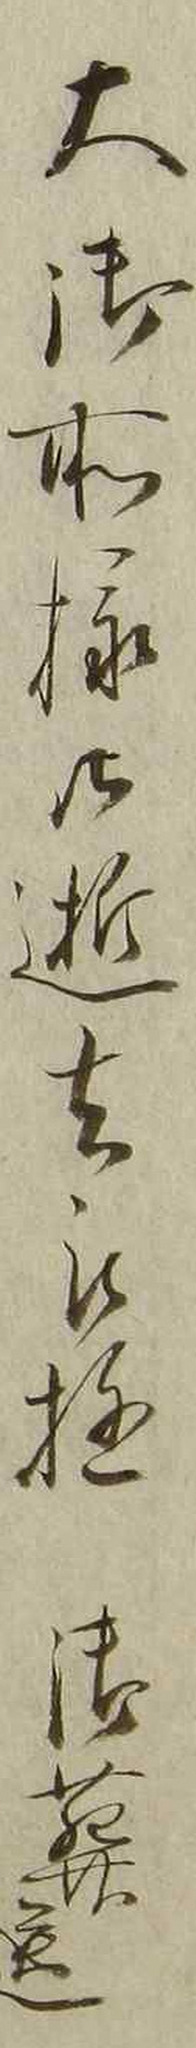大御所様御逝去被遊御葬送
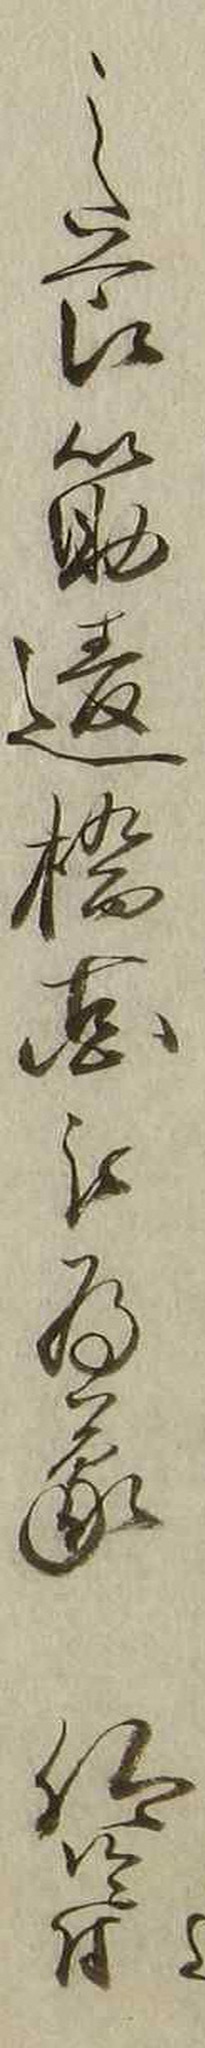之節筋違橋固被為蒙仰付候に付
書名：諸士系譜　巻之103　か之部11
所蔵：会津若松市立会津図書館
